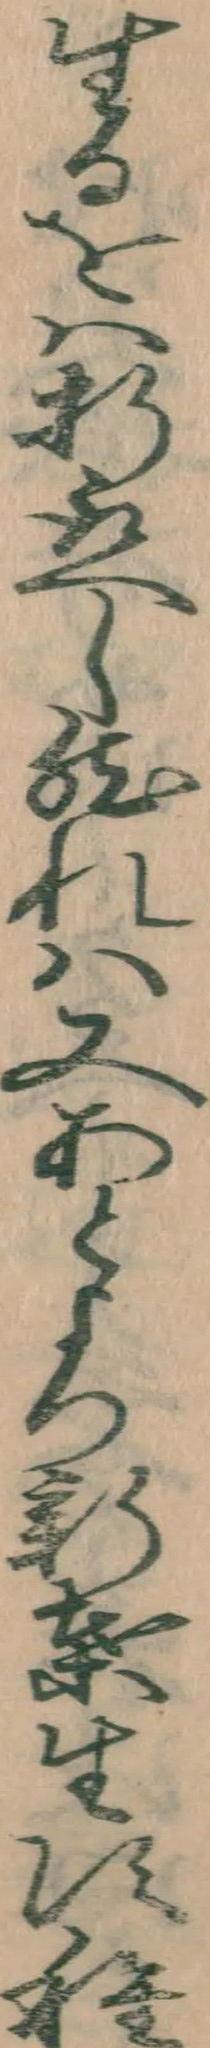生るをは折取へし然れは又あとより新葉生す種
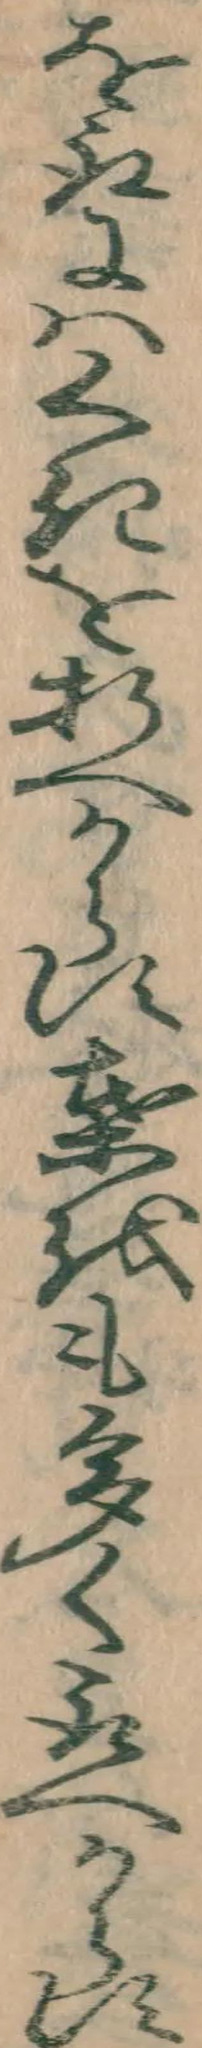を取にはくきを折へからす葉をも多く取へからす
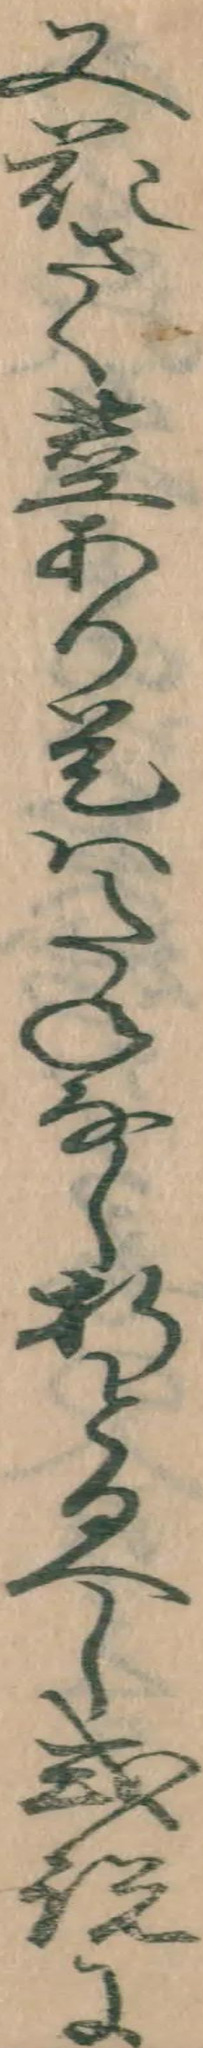又花さく茎あり是はたねなし折とるへし或説に
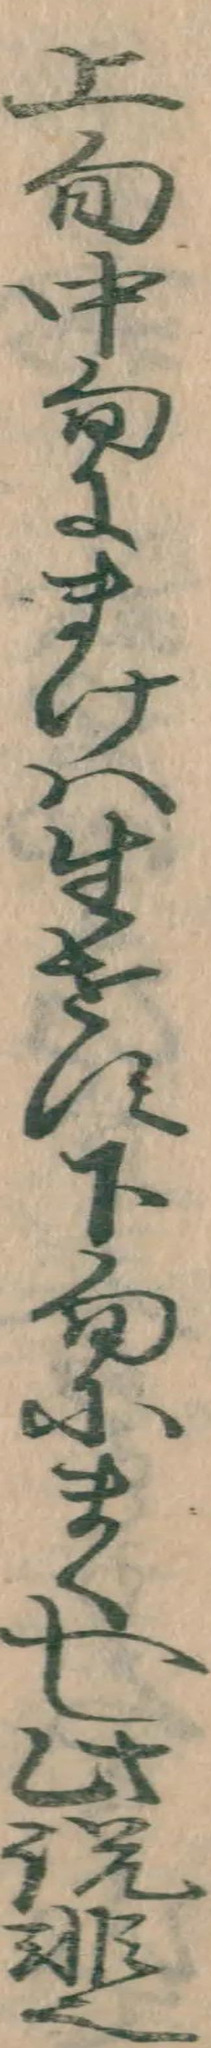上旬中旬にまけは生せす下旬にまくへし此説非也
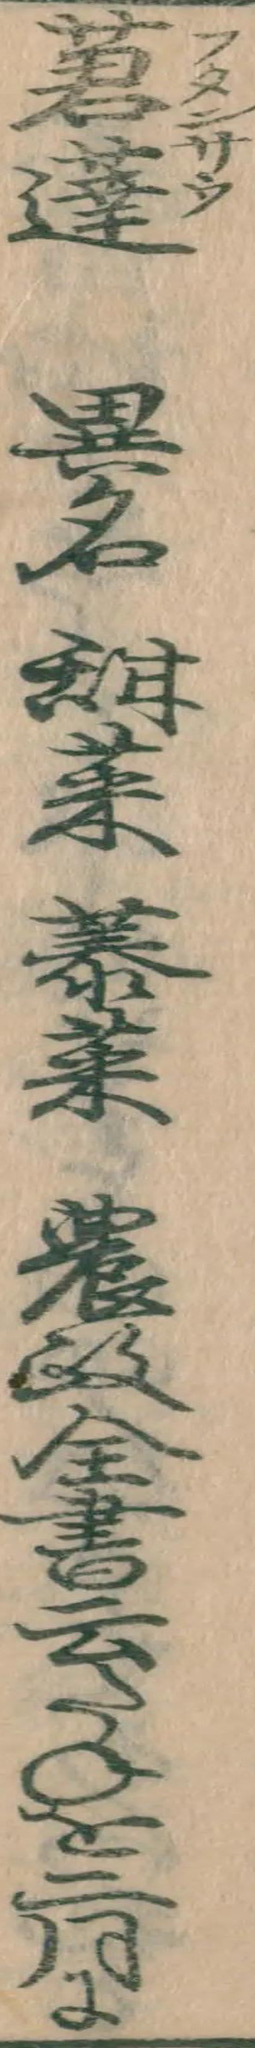莙薘異名甜菜蓁菜農政全書云たねを二月に
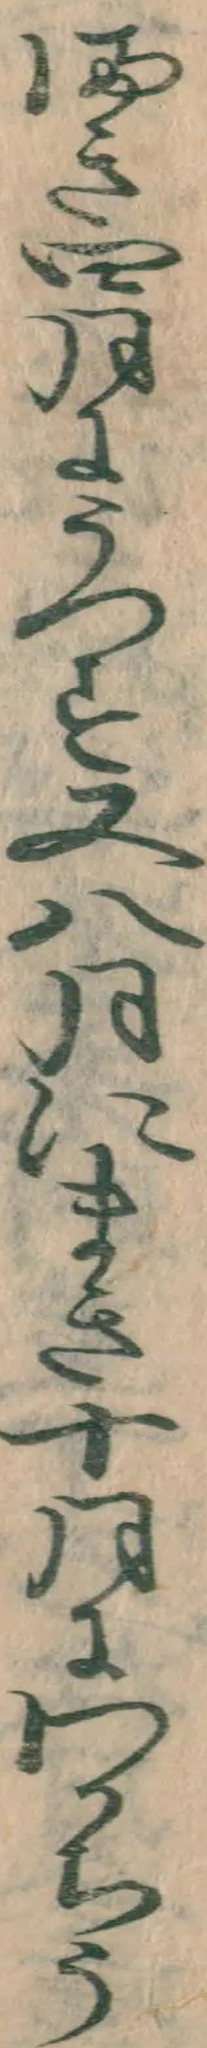まき四月にうつす又八月にまき十月にわかちう
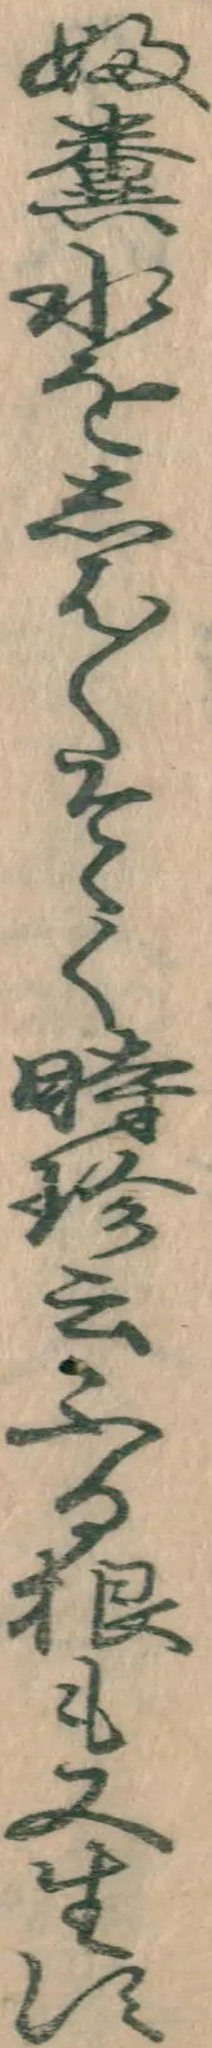ふ糞水をしは〳〵そゝく時珍云ふる根も又生す
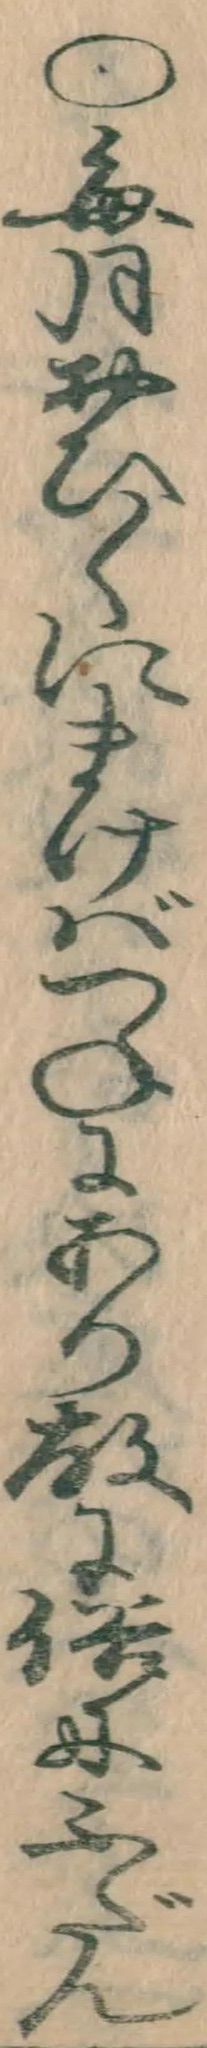〇毎月おひ〳〵にまけばつねにあり故に俗にふだん
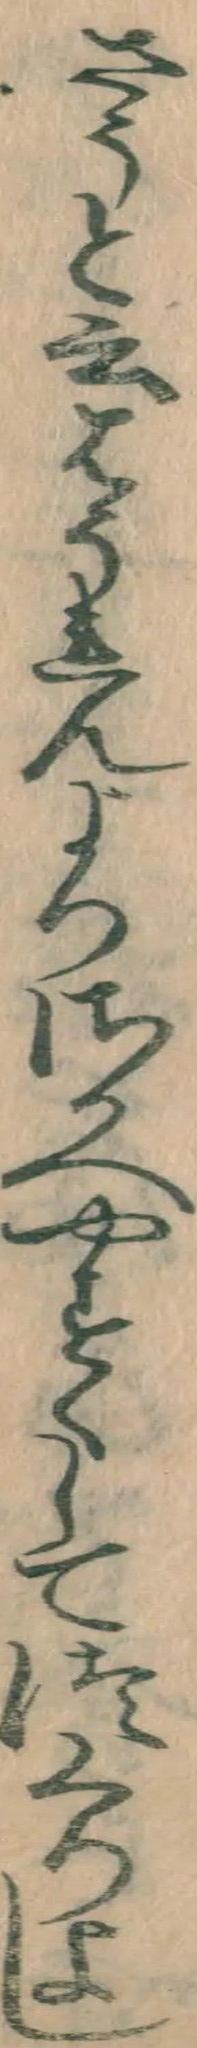さうと云はうれんとりさかへやすくしてつくりよし

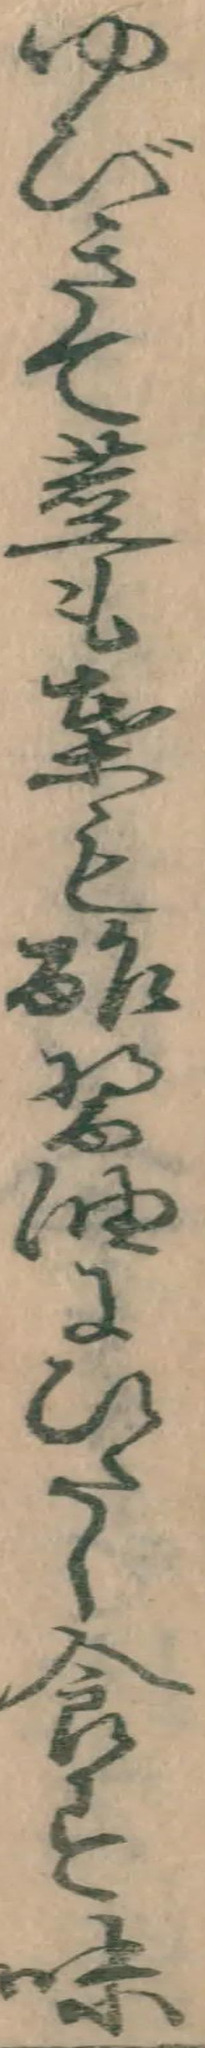ゆびきて茎も葉も酢醤油にひたし食す味
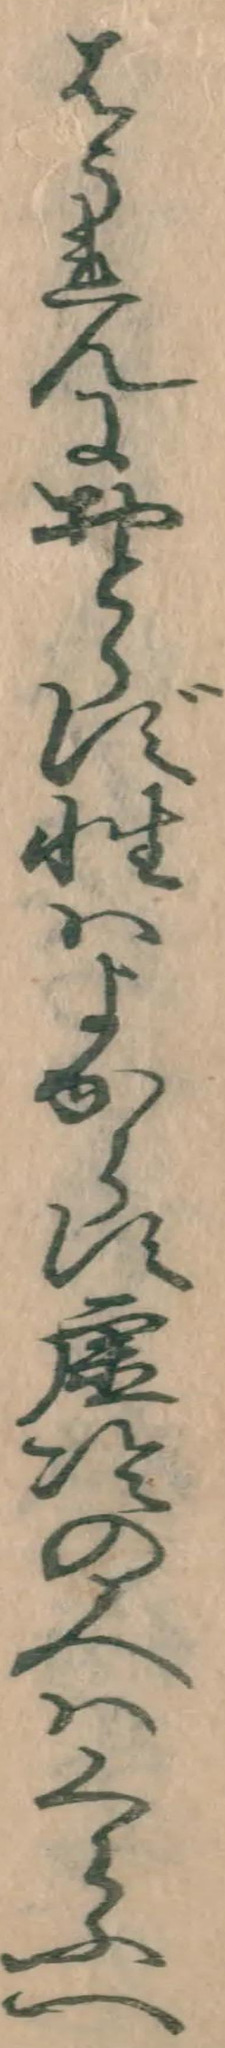はうれんにおとらず性はよからす虚冷の人はくらふへ
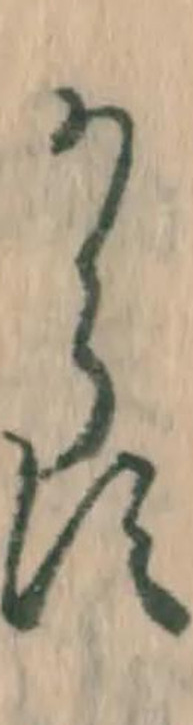からす
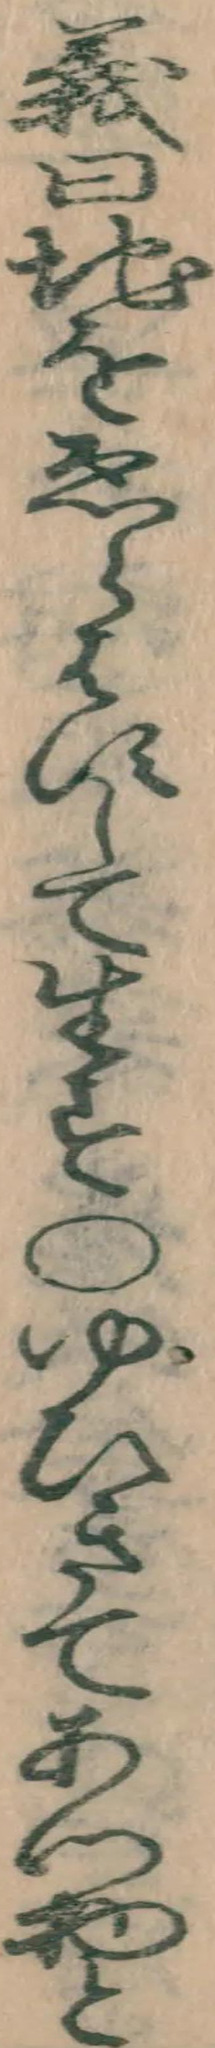義曰地をゑらはすして生す〇ゆひきてあつ物と
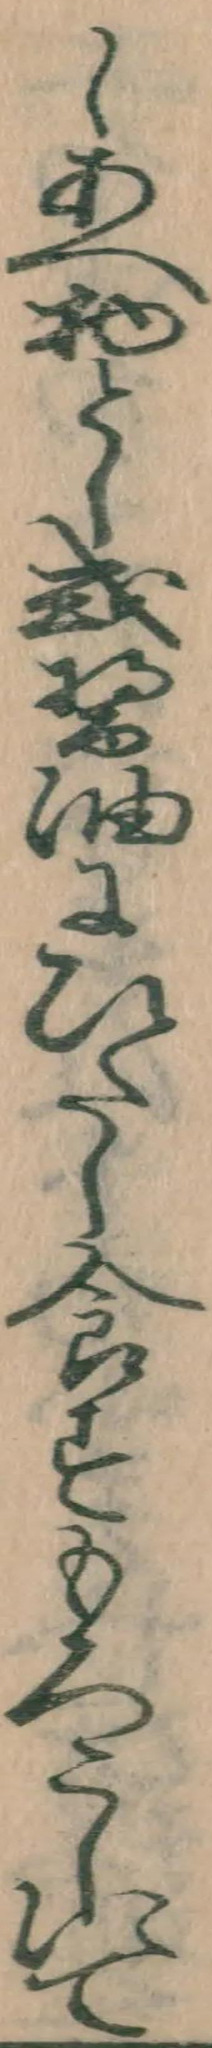しあへ物とし或醤油にひたし食すもろこしにて
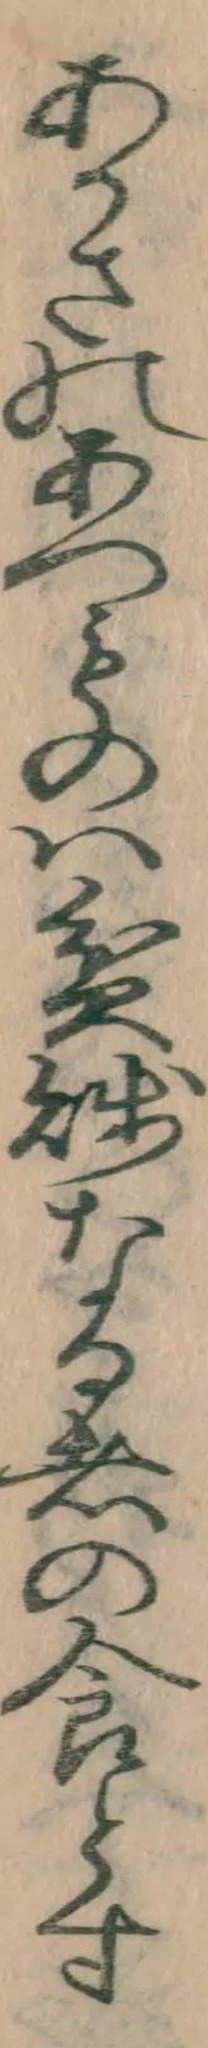あかさのあつものは貧賤なる者の食とす
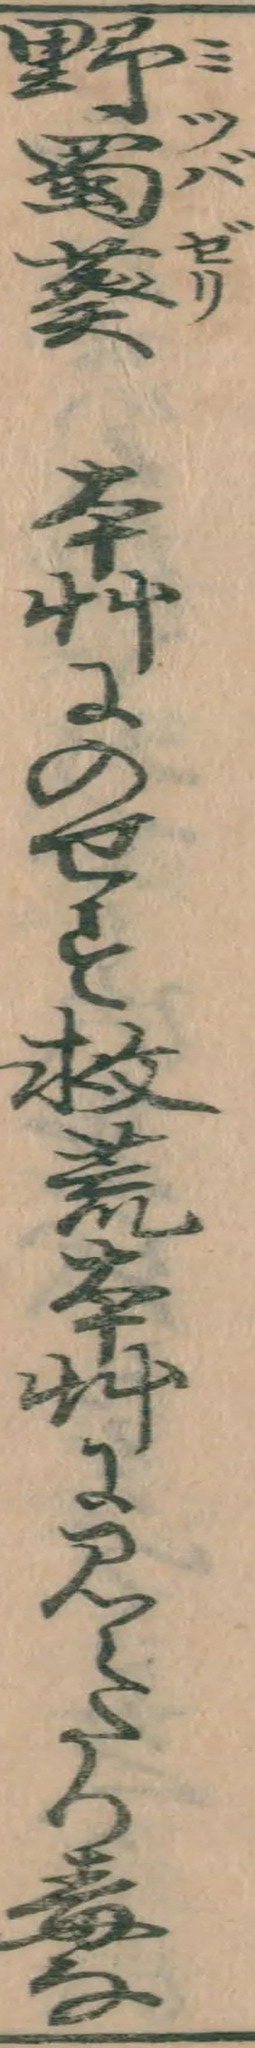野蜀葵本艸にのせす救荒本艸に見たり毒な
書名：菜譜 3巻
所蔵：国立国会図書館 National Diet Library, JAPAN
